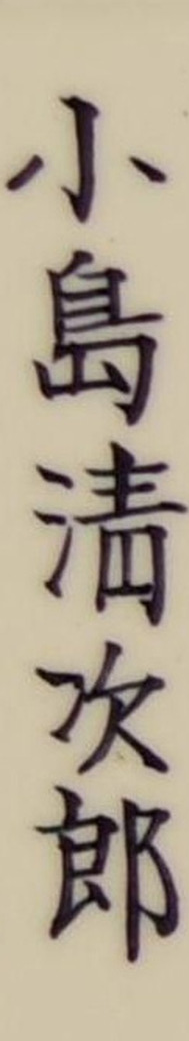小島清次郎

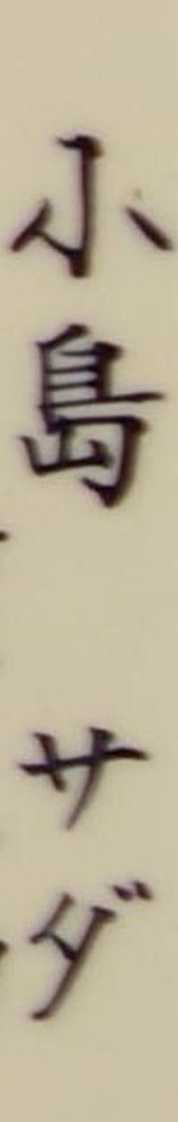小島サダ
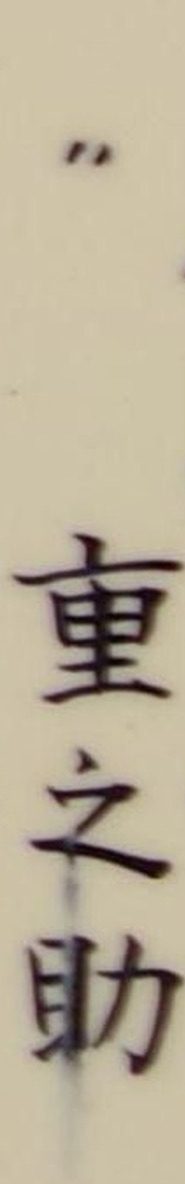重之助
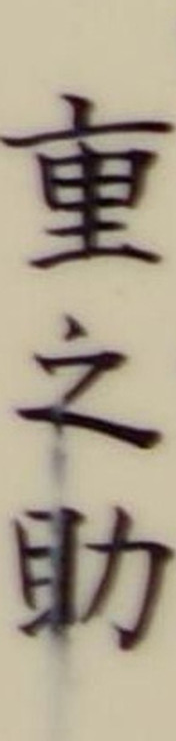重之助
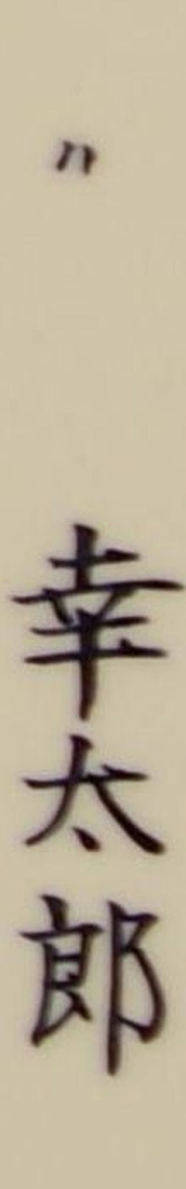幸太郎
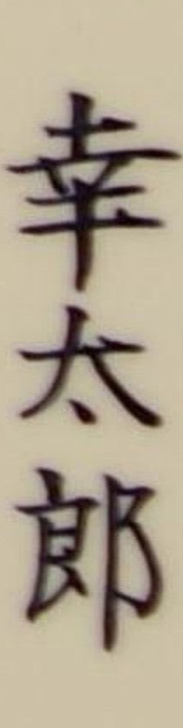幸太郎
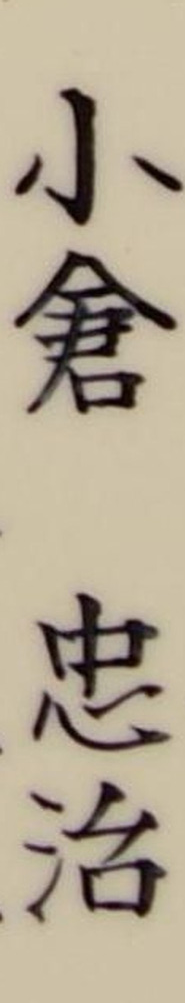小倉忠治
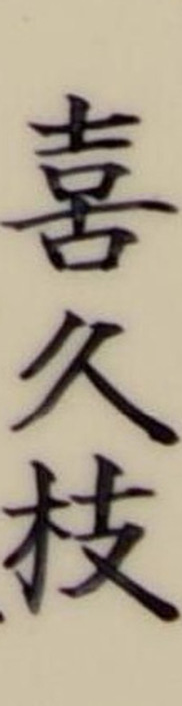喜久枝
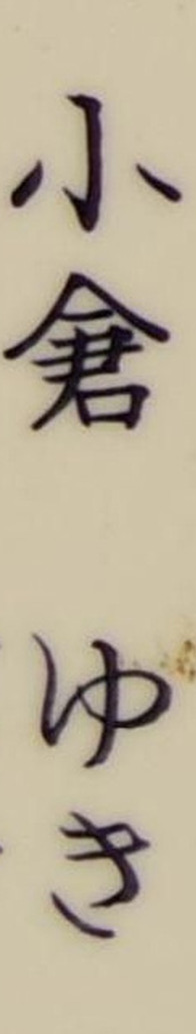小倉ゆき

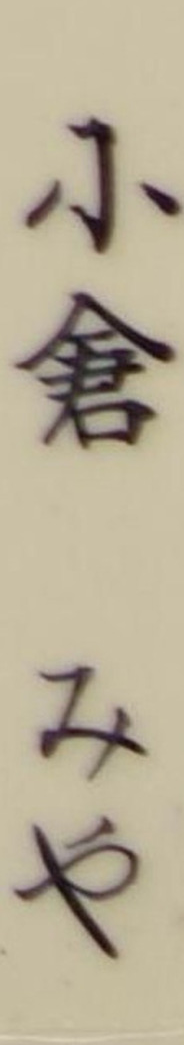小倉みや
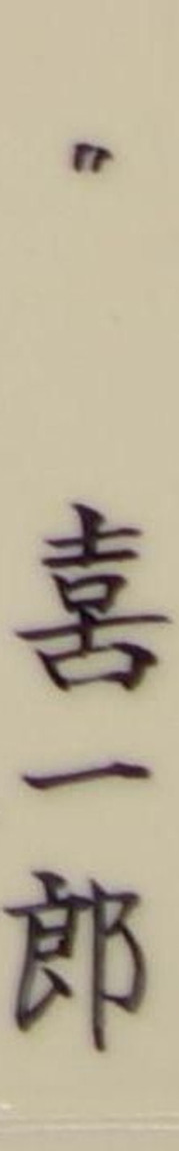喜一郎
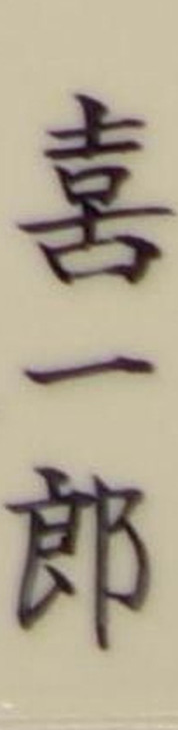喜一郎
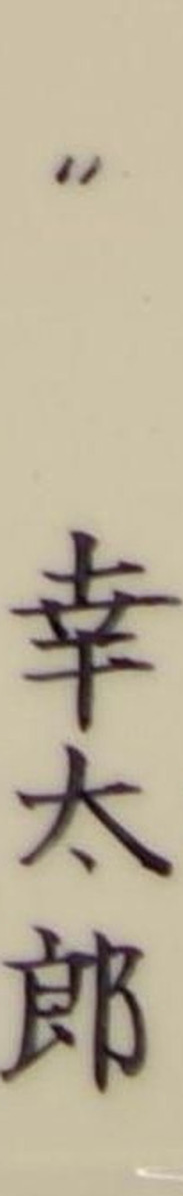幸太郎
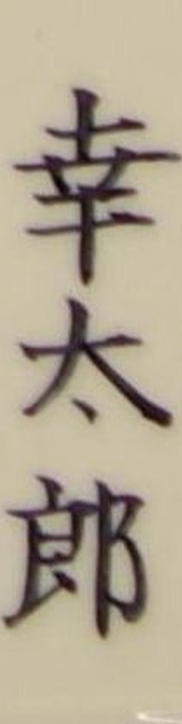幸太郎
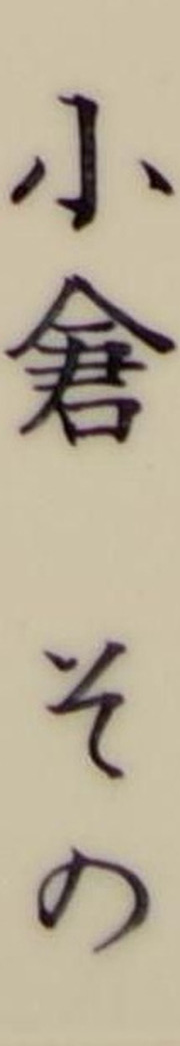小倉その
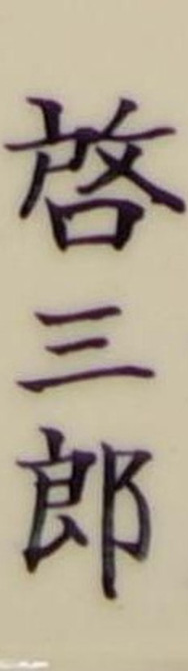啓三郎
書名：E~L
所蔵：高野山金剛峯寺
